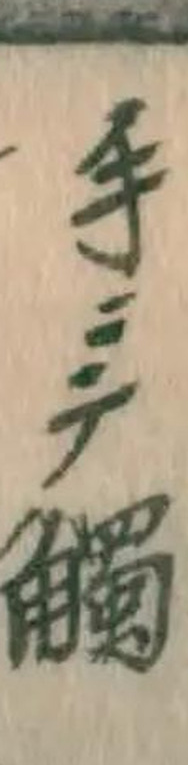手ニテ觸
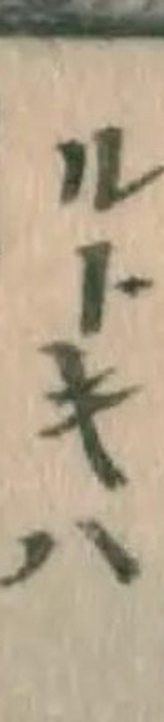ルトキハ
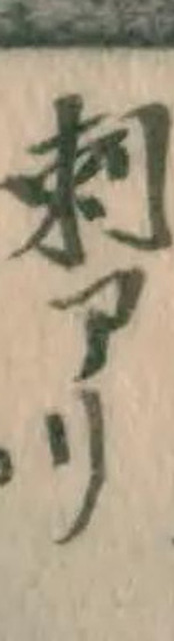刺アリ
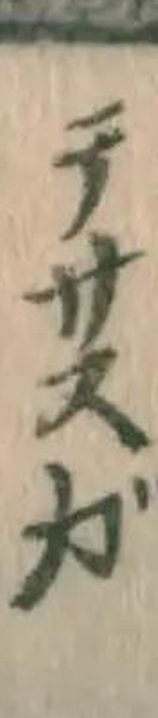テサスガ
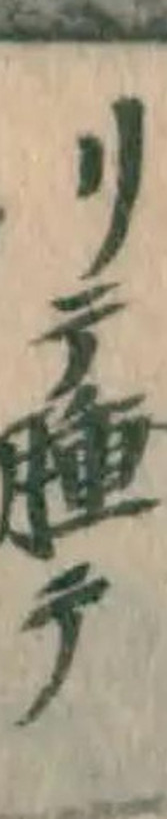リテ腫テ
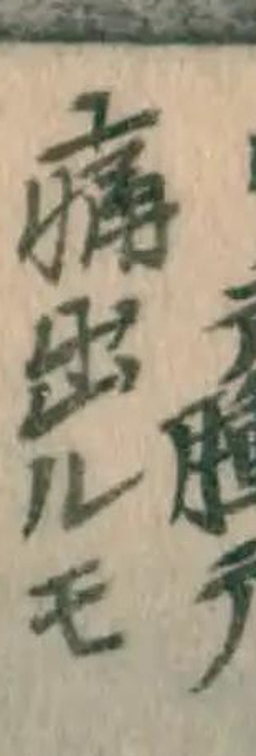痛出ルモ
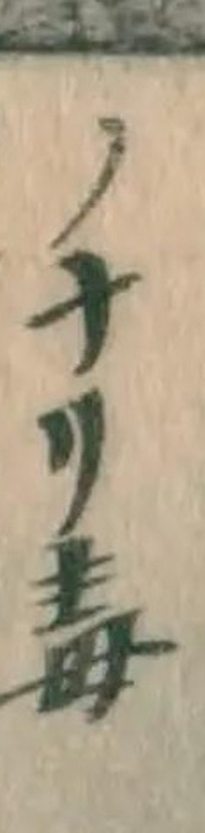ノナリ毒
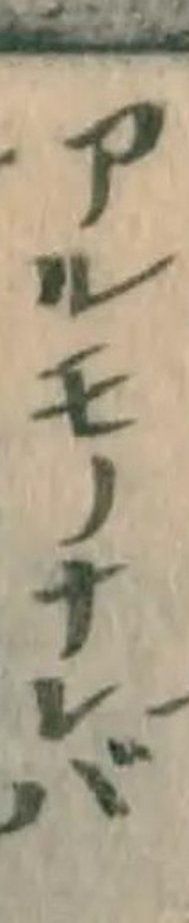アルモノナレバ
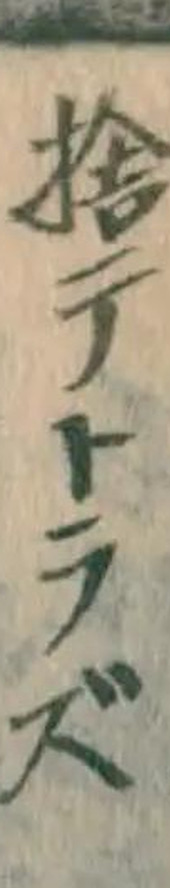捨テトラズ
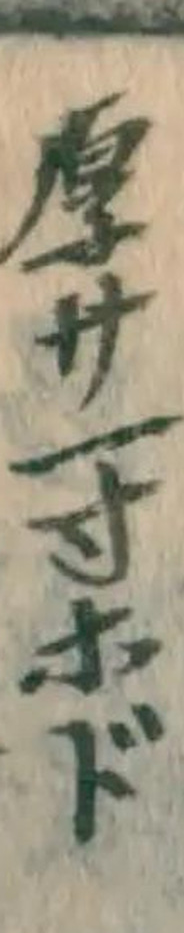厚サ一寸ホド
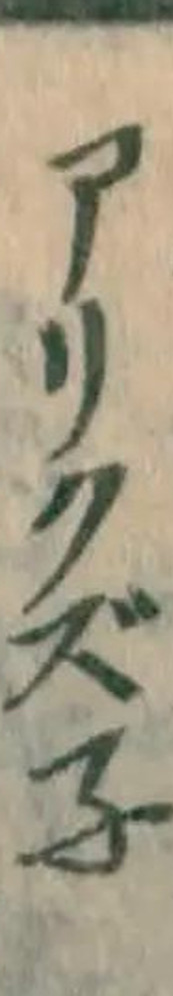アリクズネ
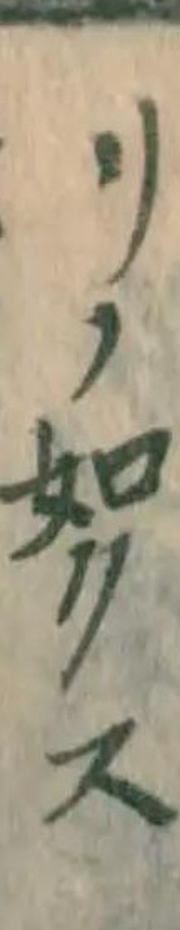リノ如クス
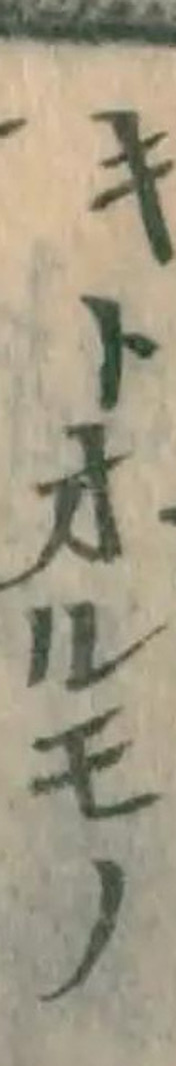キトオルモノ

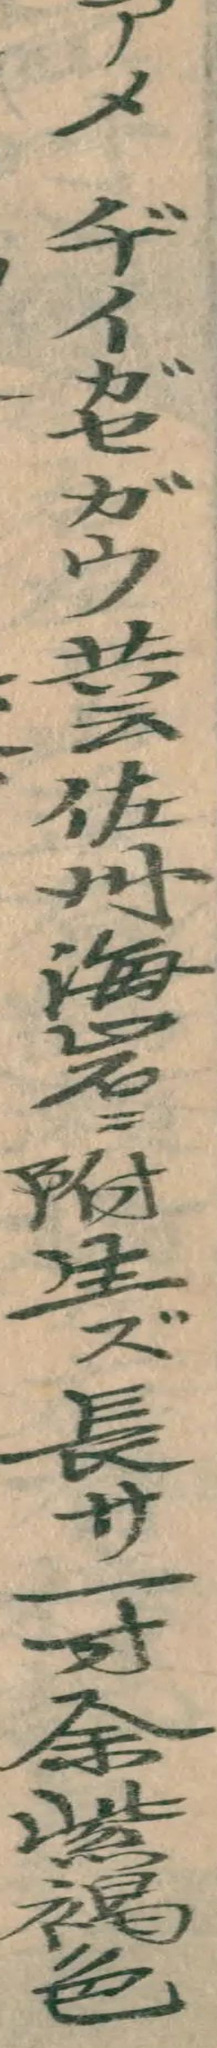アメヂイガセガウ共云佐州海岩ニ附生ズ長サ一寸余紫褐色
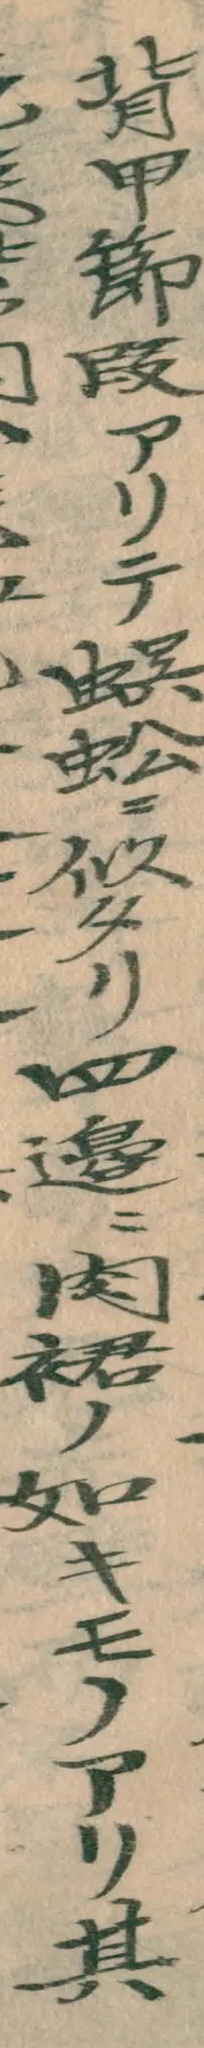背甲節段アリテ蜈蚣ニ似タリ四邉ニ肉裙ノ如キモノアリ其
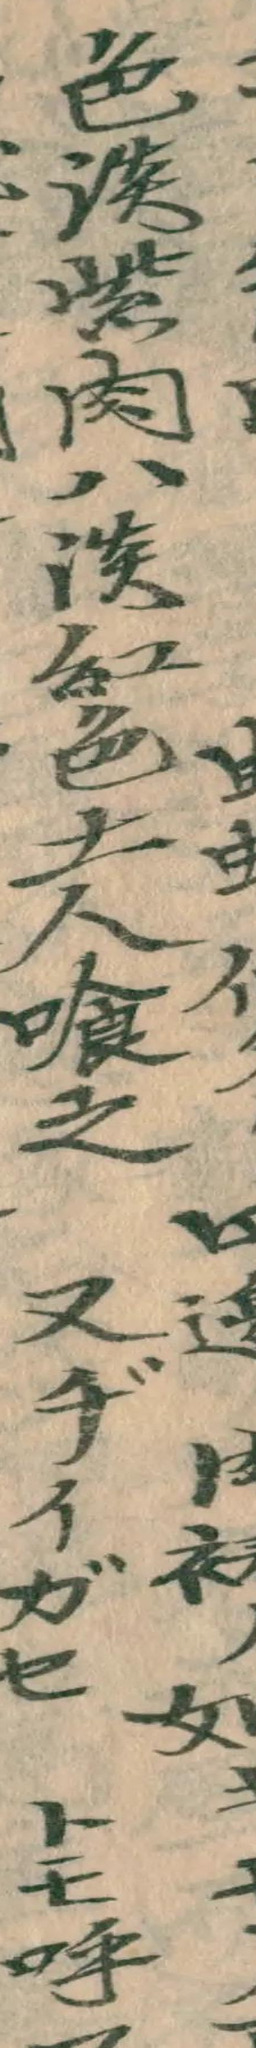色淡紫肉ハ淡紅色土人喰之又ヂイガセトモ呼フ
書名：千蟲譜 3巻. [1]
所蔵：国立国会図書館 National Diet Library, JAPAN
